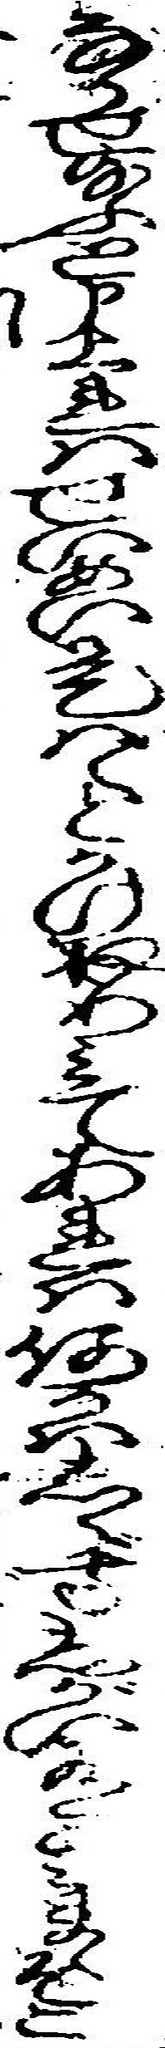ならせ給ふと申上れはせいめい是は〳〵とかけおりみてあれは何かはしらずしがい有其まゝそこ
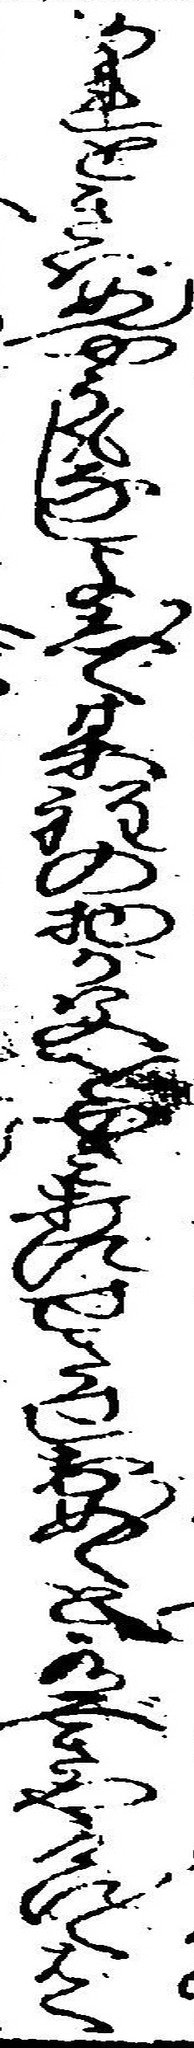かれときはめんやうもなしよし〳〵某程の物か父をやみ打にせさせおめ〳〵と有べきやけに〳〵はく
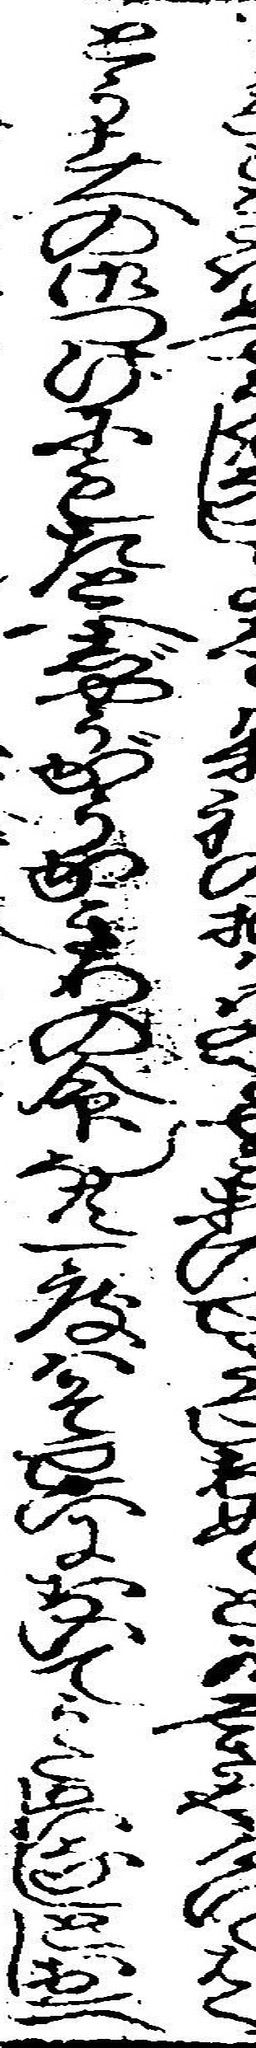とう上人の御つげにもたとへじやうがうかきりの命也共一度はそせいにおいてうたかいなしとおしへ
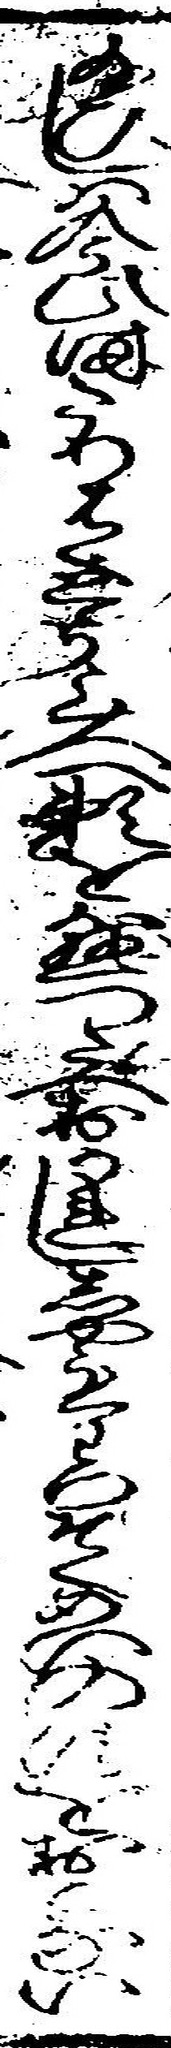給ひしは今此時たりはくとう上人へ頼を懸つたへおかれししやうくわつそくめいのをおこない
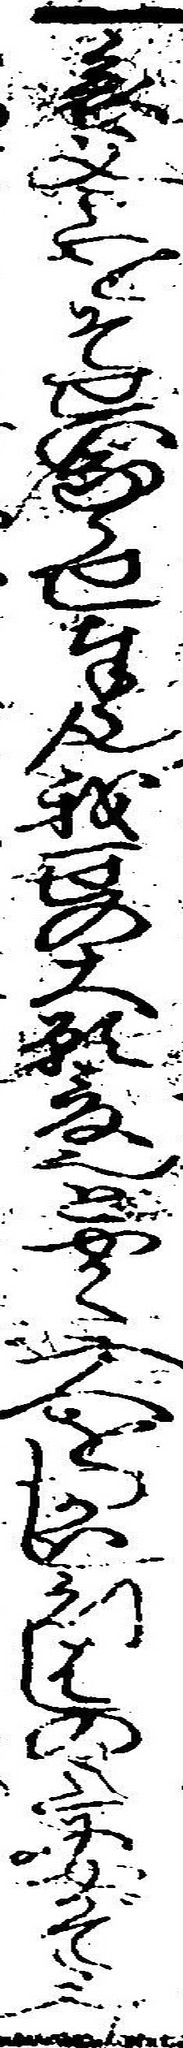哀父上をそせいならせ奉らん我一せの大頼爰也とやかたへ人をつかはし則はしの上にやがてたん
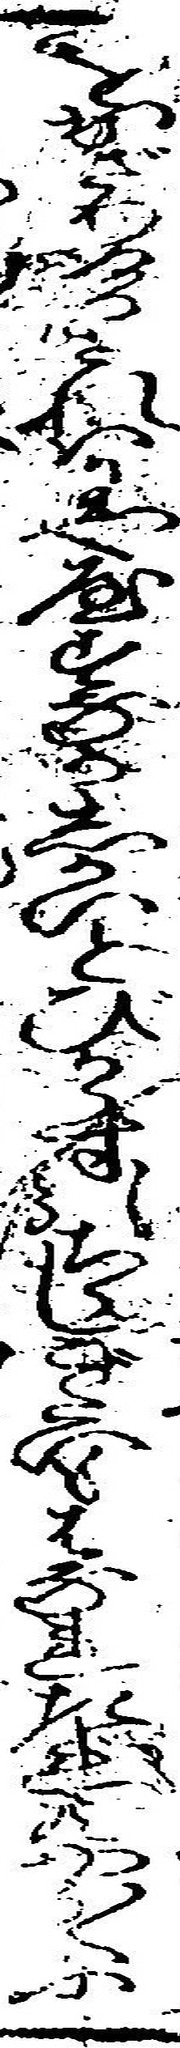をかざりけるされはにややすなかしかいとびからす引ちらしごたいもはなれたれ共やう〳〵に
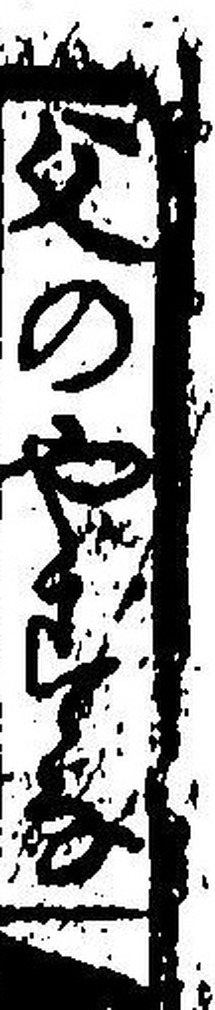父のやすな
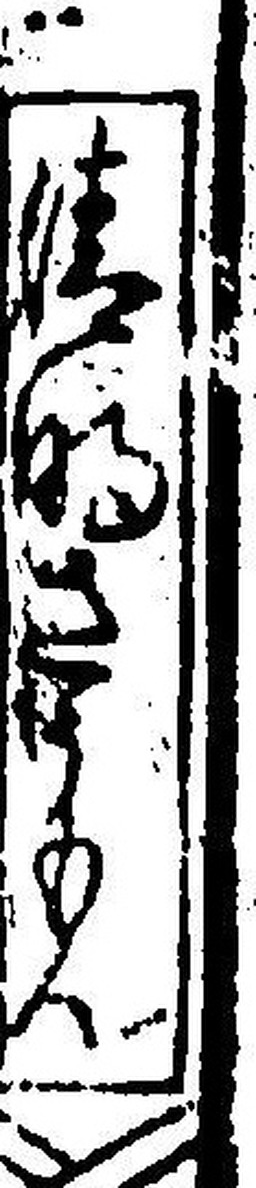清明さうもん
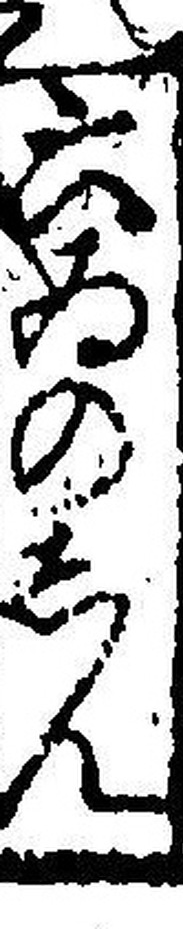六ゐのしん

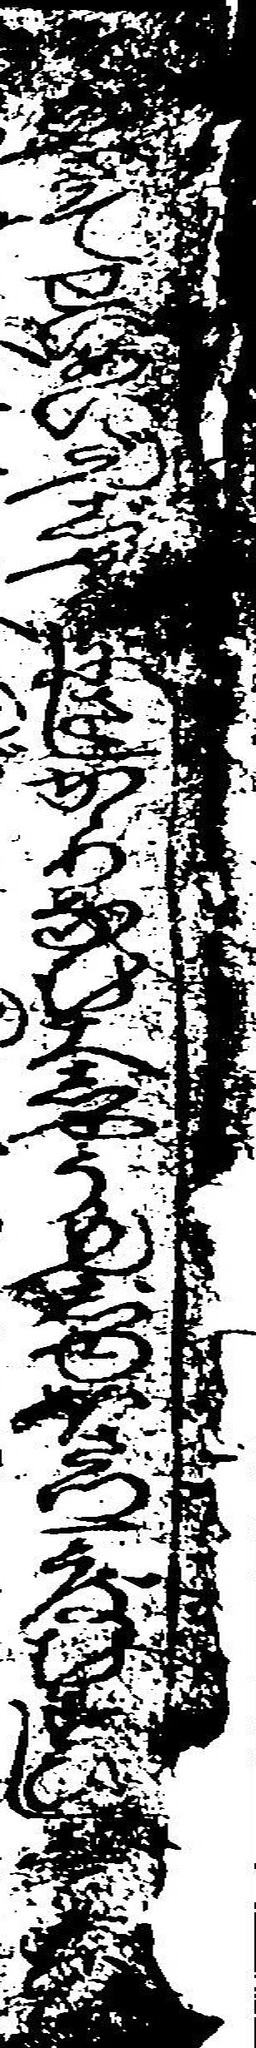そなへさてせいめいだんじやうにさしかゝりなむ大しやうもんじゆぼさつ一度むすひし
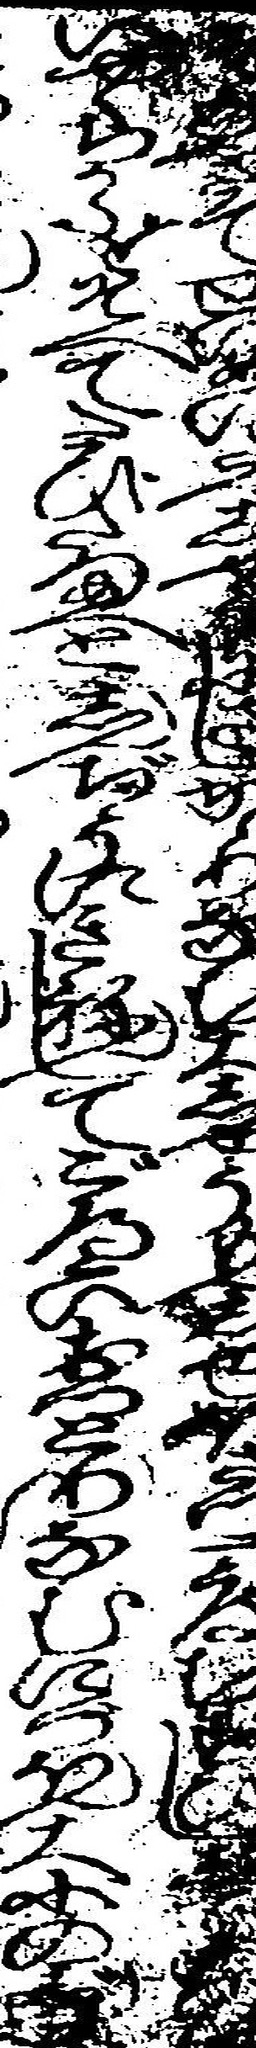いやくちからをそへてたびたまへとしんじうにきねんしてごへいおつとりなむにつほん大小の
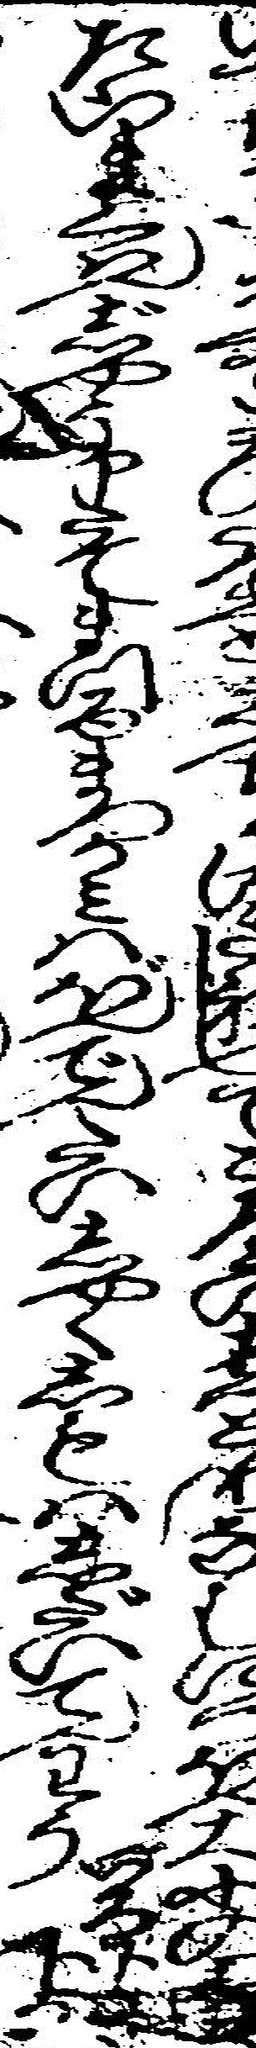たゝいまくわんじやう申たてまつるまつかみはぼんでんたいしやくしもはしだいてんわういろ下
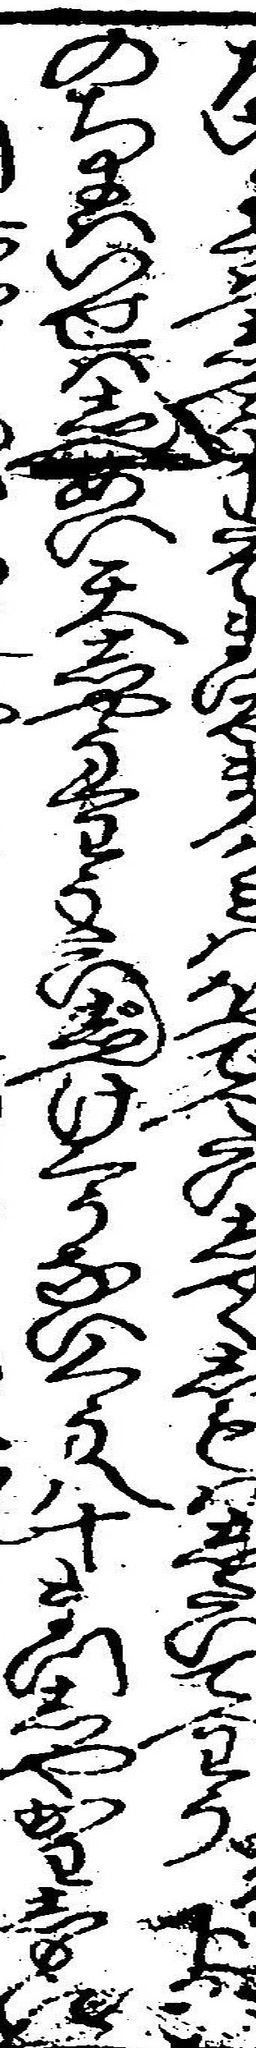のちにはいせはしんめい天しやうくわうたいじんけくうないくう八十まつしやかわしもに
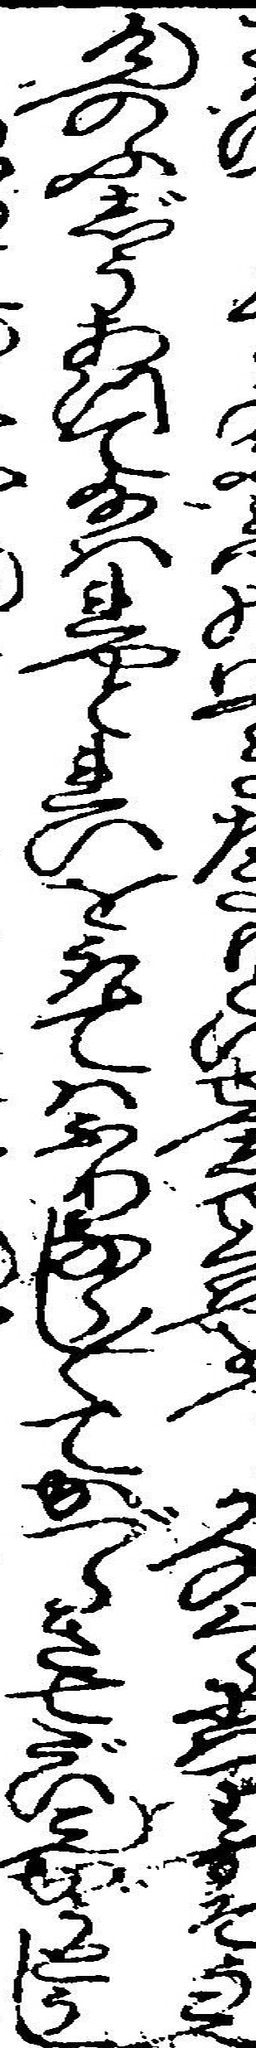けんのふじうあつて給はれやとれいを取てはふりならし〳〵てかづらきなゝだいこんがうとうし
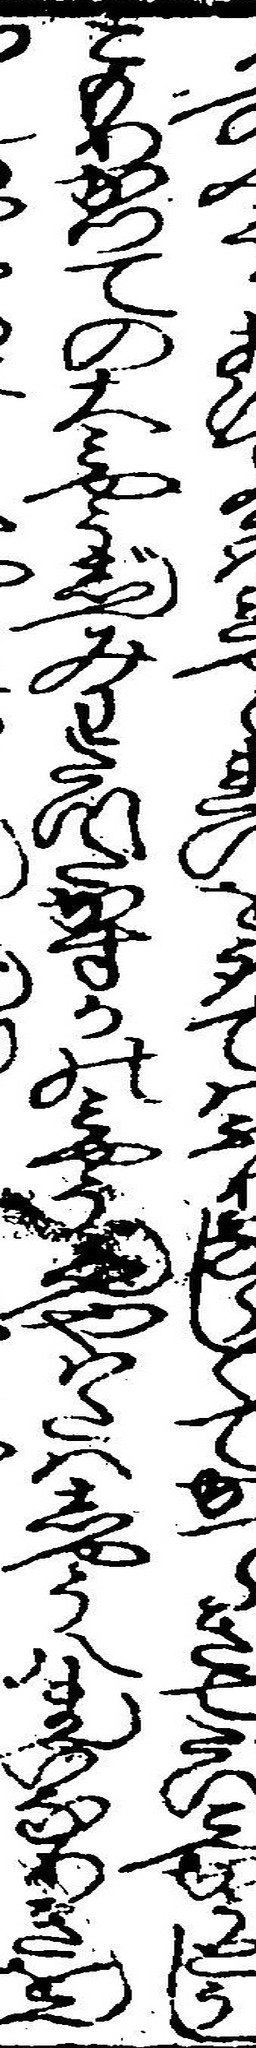こもりかつての大みやうじんみわたつたかすかのみやうしんやはたはしやう八まんいなりきをん
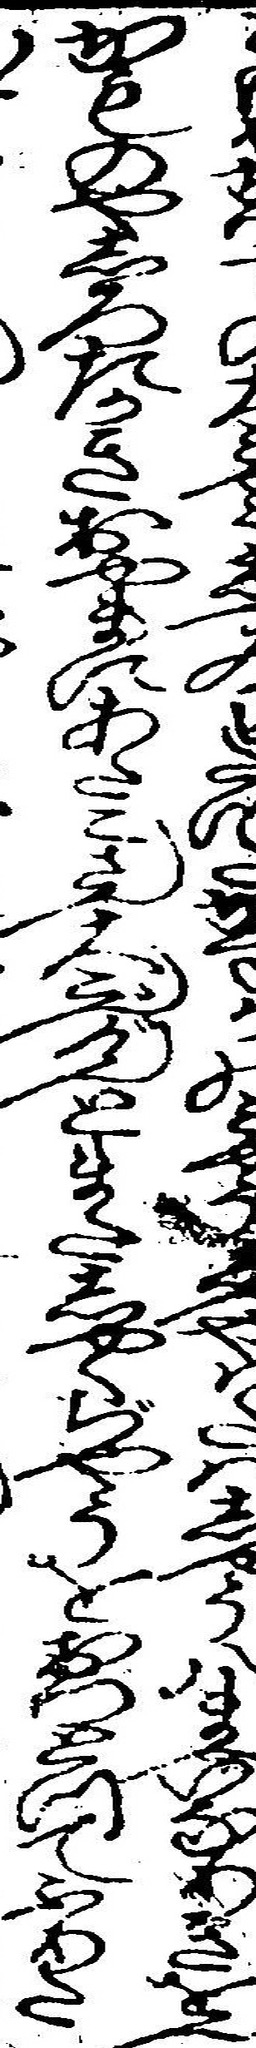かものやしろたかきおやまにあたこさん大ごんげんとまたしやくじやうをおつとつてふりた
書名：[しのだづまつりぎつね付あべの清明出生]
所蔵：東京大学総合図書館 General Library in the University of Tokyo, JAPAN
